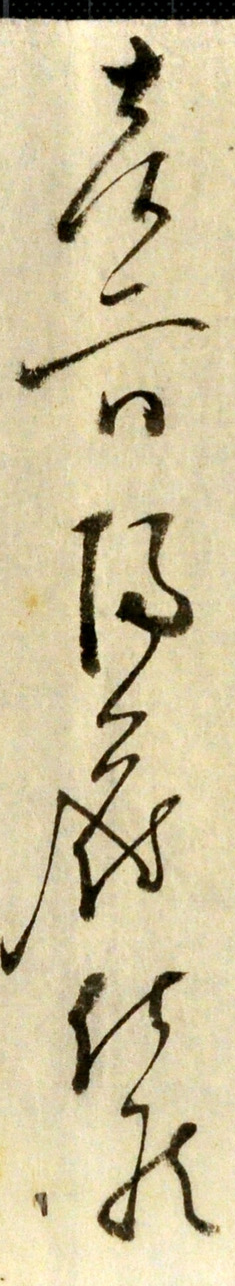去二日帰府仕候
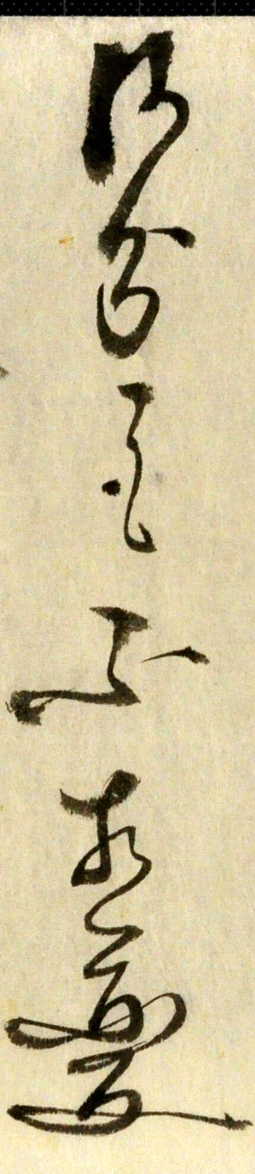何分にも不相変

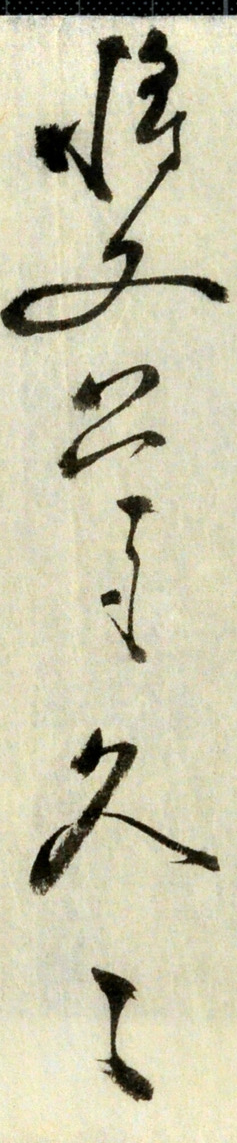将又公にも久々

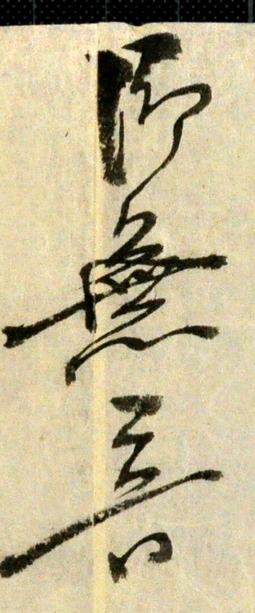御無音
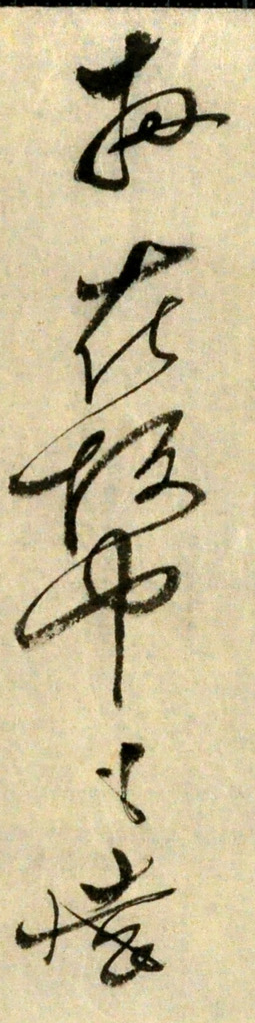扨在坂中も懐
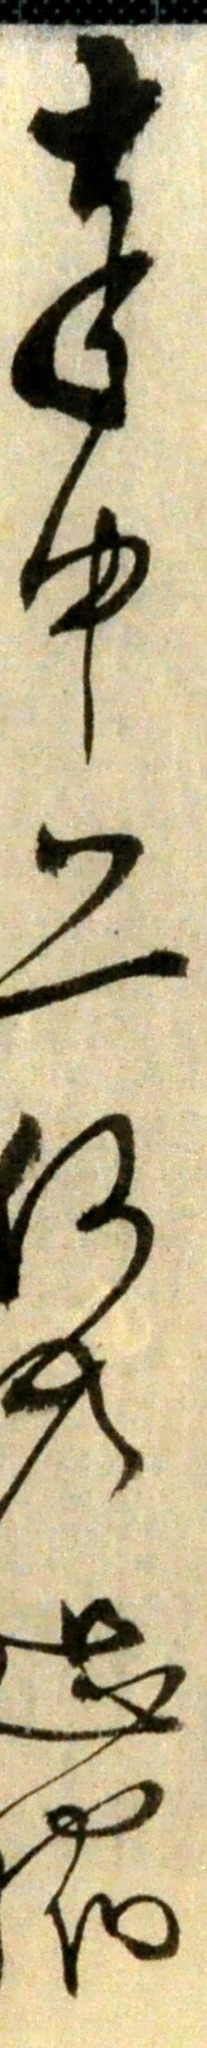奉申上何共恐縮

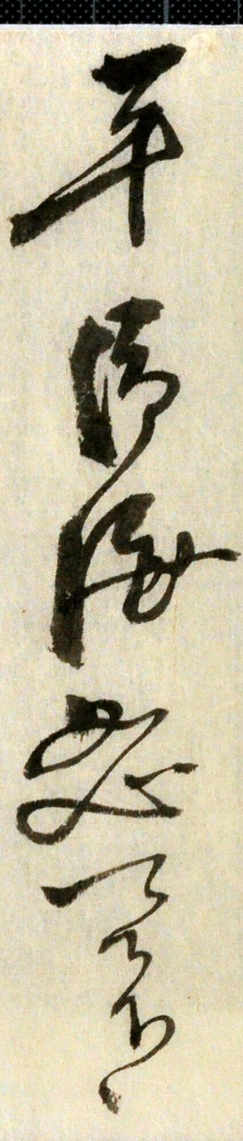平御海恕可被下候
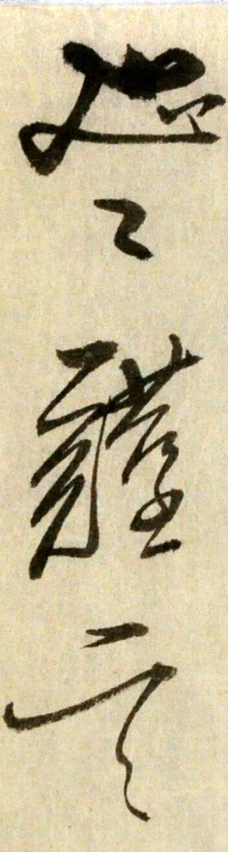恐々謹言
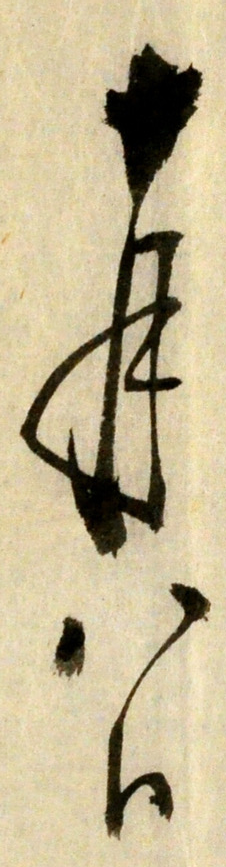十月八日
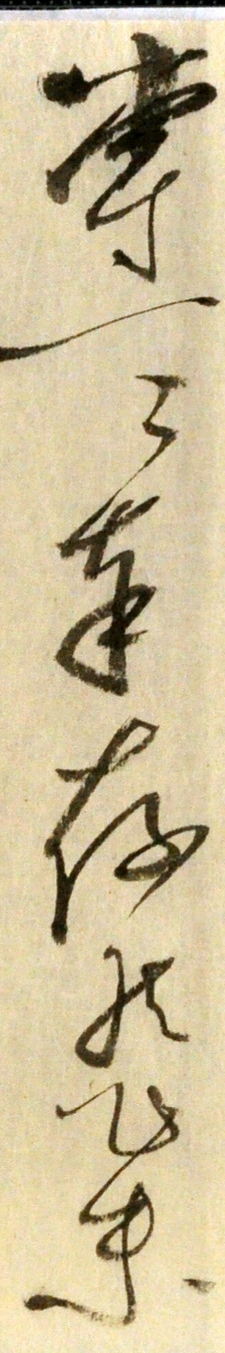専一ニ奉存候乍末
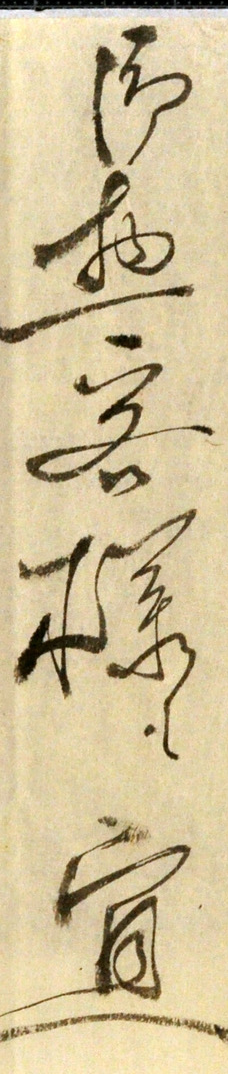御惣客様も宜
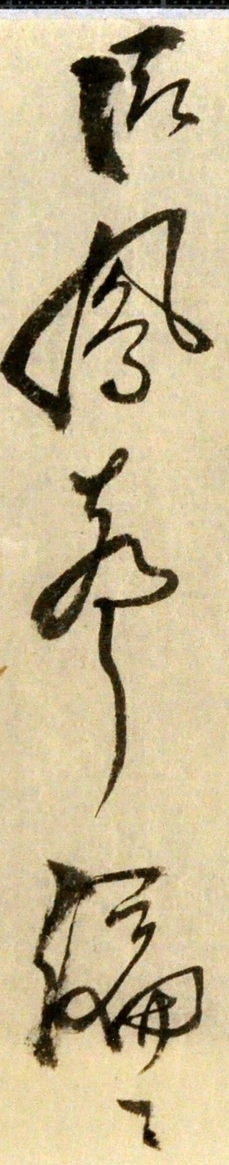御鳳声偏ニ

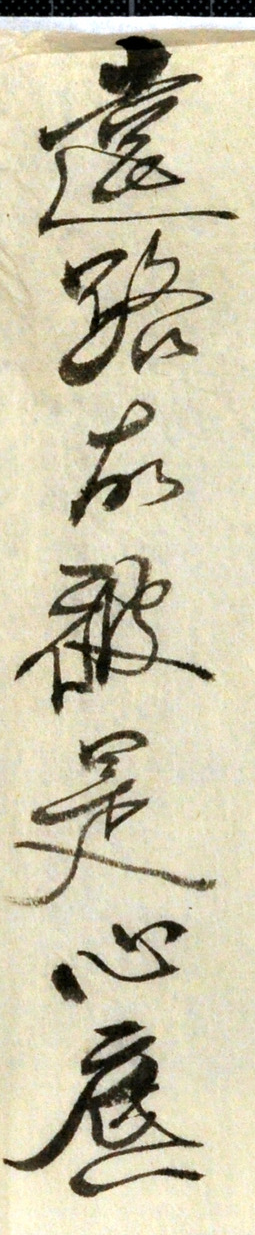遠路故彼是心底ニ
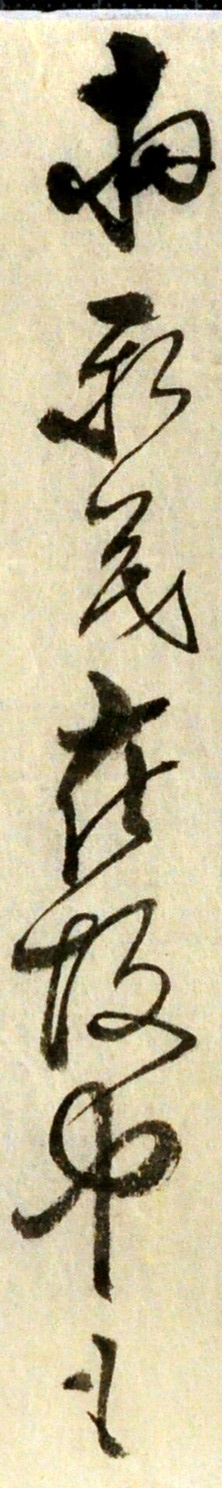扨私義在坂中も
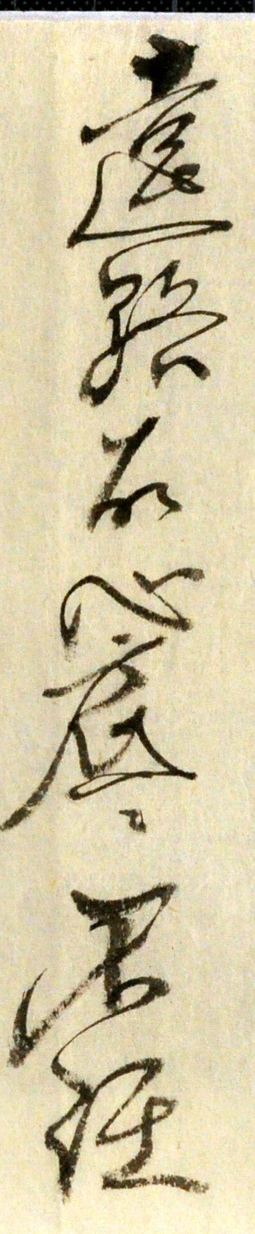遠路故心底ニ不任
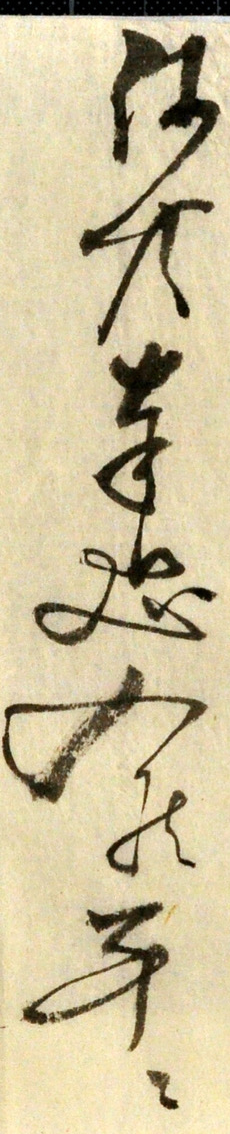何共奉恐入候平ニ
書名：大阪加番関係諸書留〔一括〕
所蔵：伊那市立高遠町図書館・合同会社AMANE
